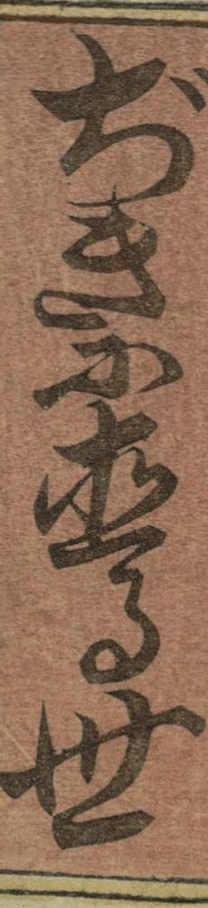ぢきに直る世
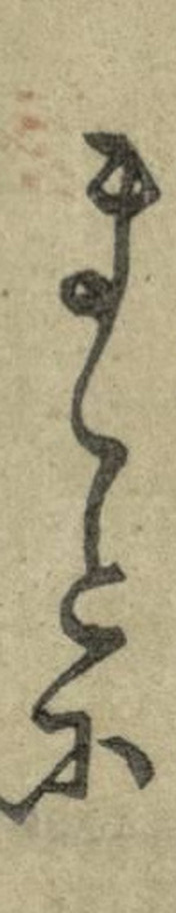まことに
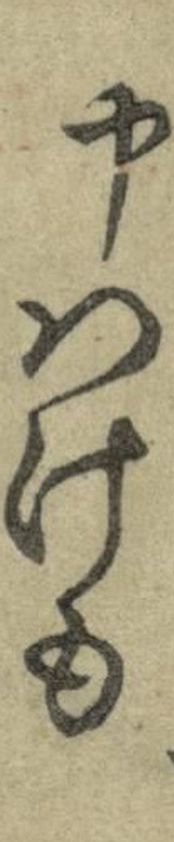申はけも
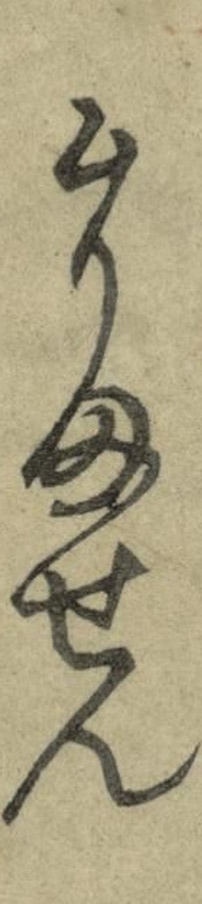厶りません
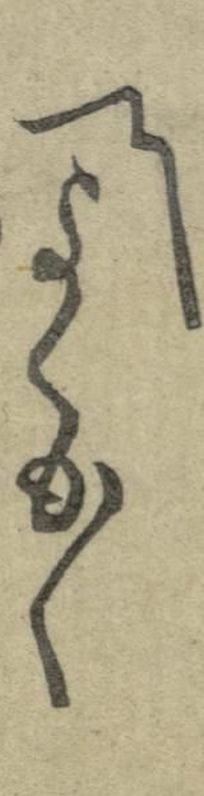〽よくも〳〵
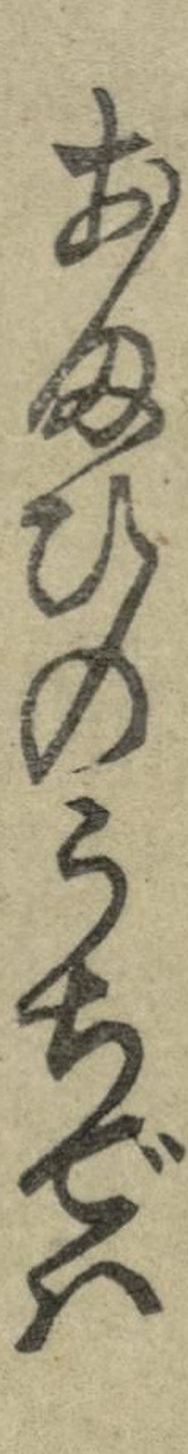おまひのうちでは
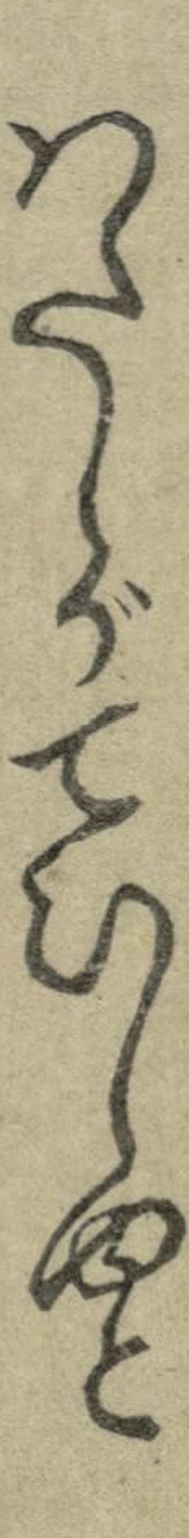はたしがていしゆと
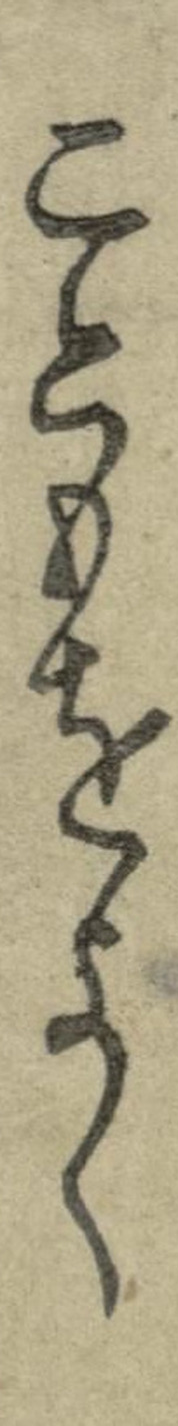こともをよく
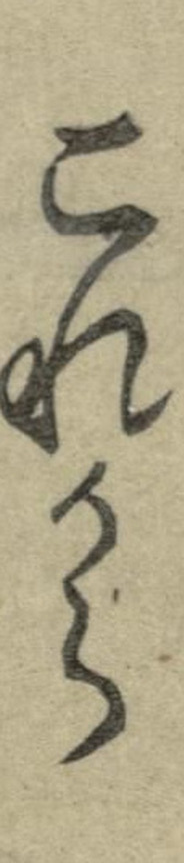これから
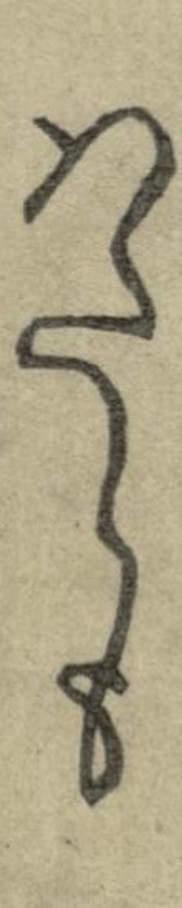はたしも
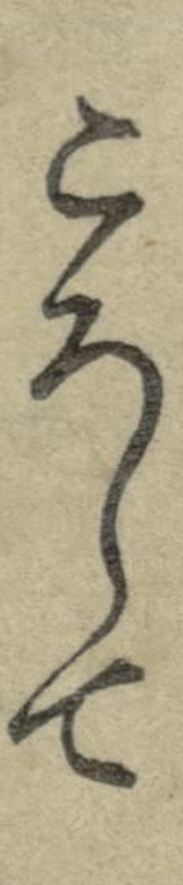ころして
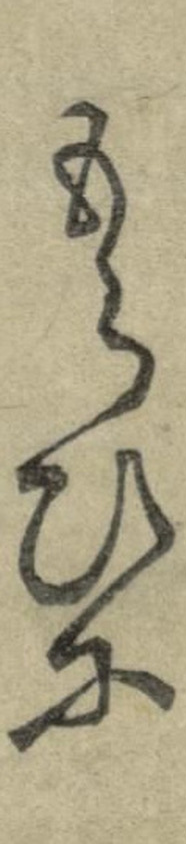もらひに
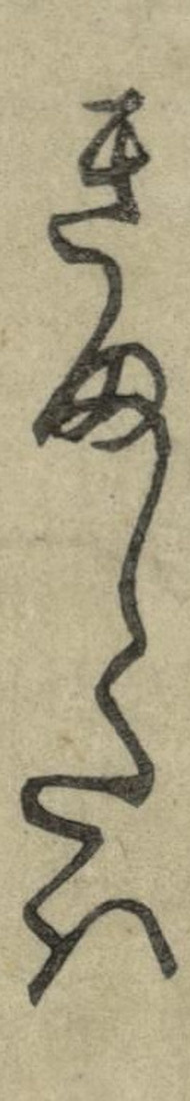きましたは
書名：ぢきに直る世
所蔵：東京大学地震研究所図書室 Earthquake Research Institute Library, The University of Tokyo, JAPAN
